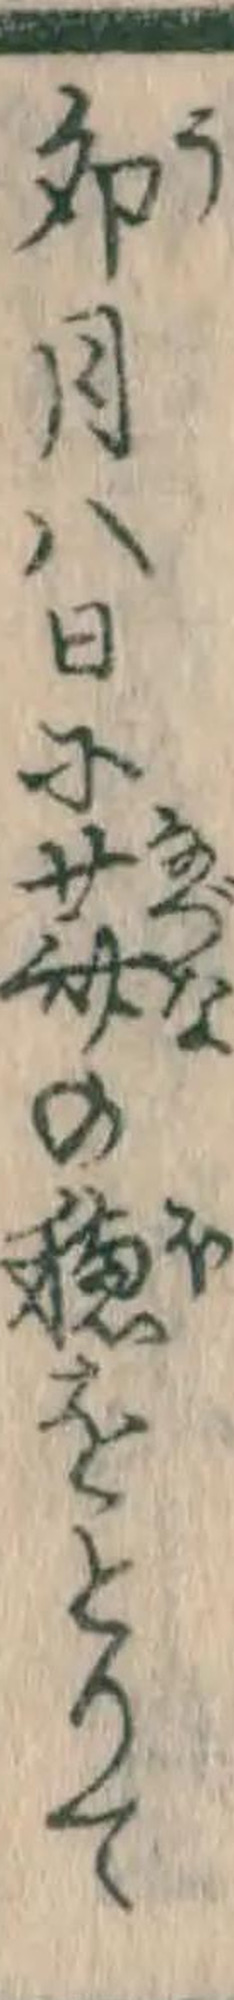卯月八日に薺の穂をとりて
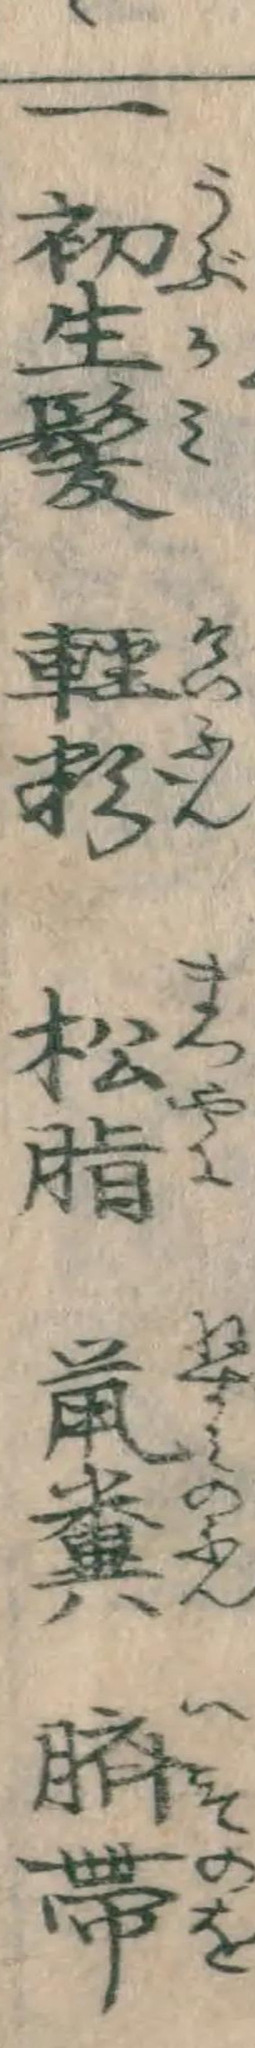一初生髪軽粉松脂鼠糞臍帯

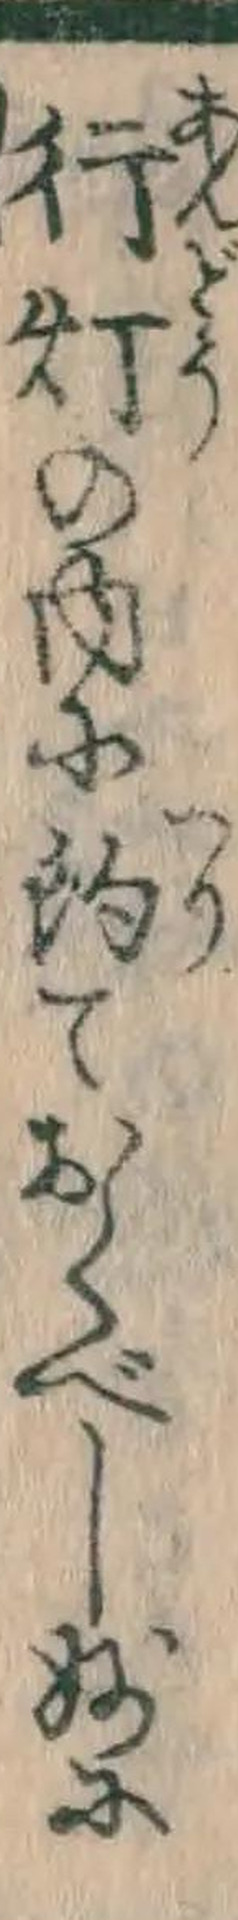行灯の内に釣ておくべし妙に
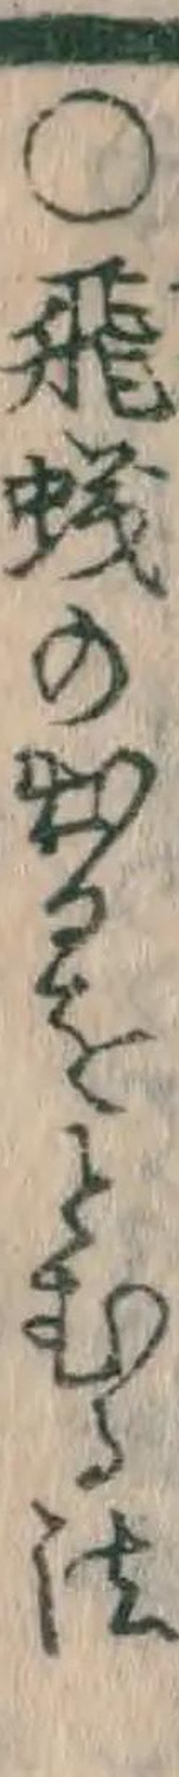○飛蟻の出るをとむる法
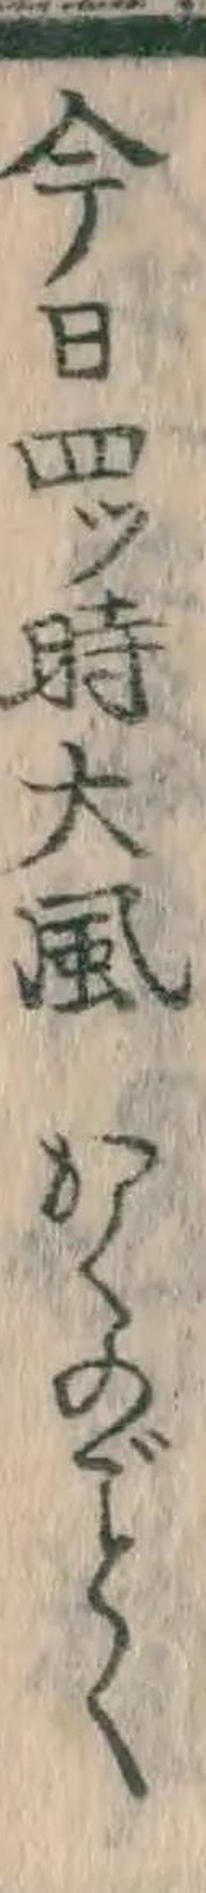今日四ッ時大風かくのごとく
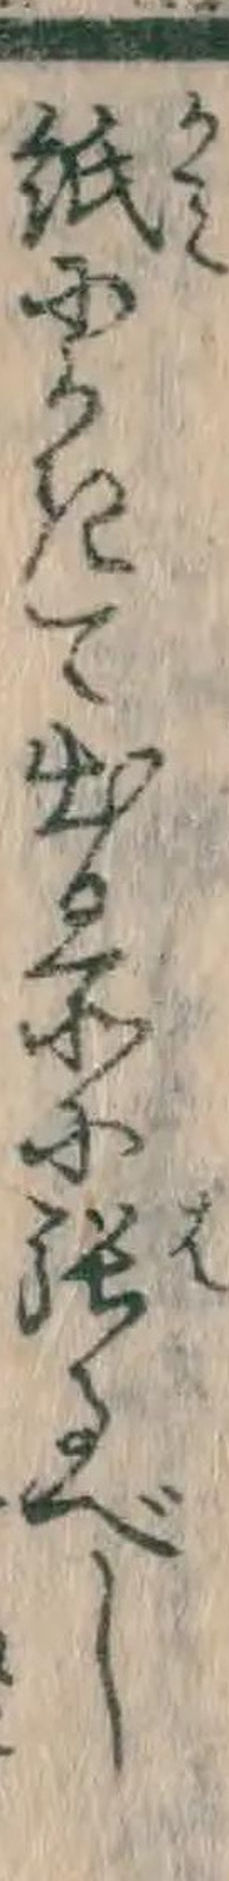紙にかきて出る所に張るべし
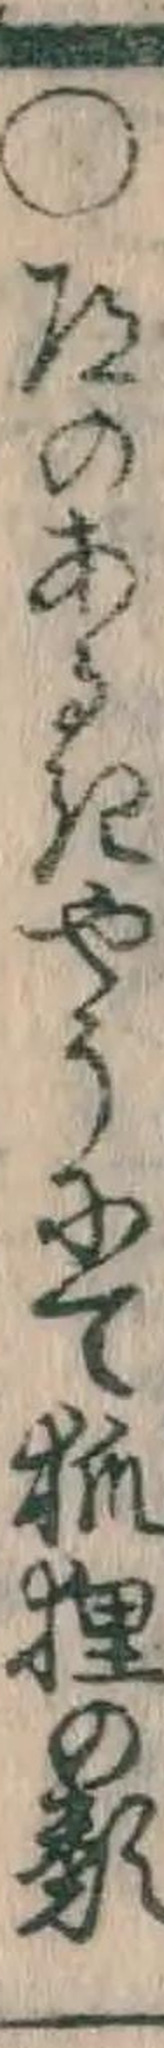○道のあるきやうにて狐狸の類
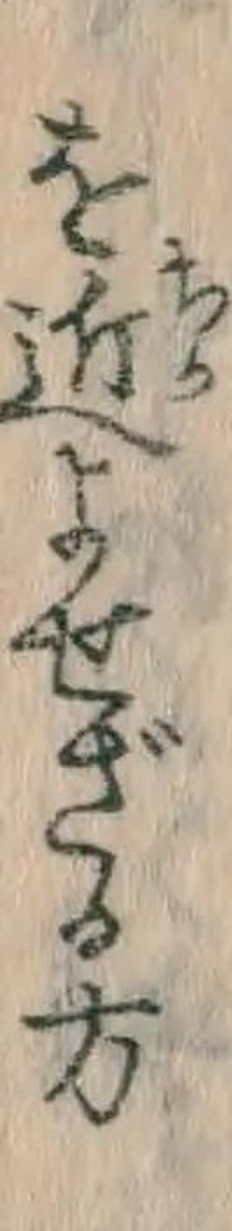を近よせざる方
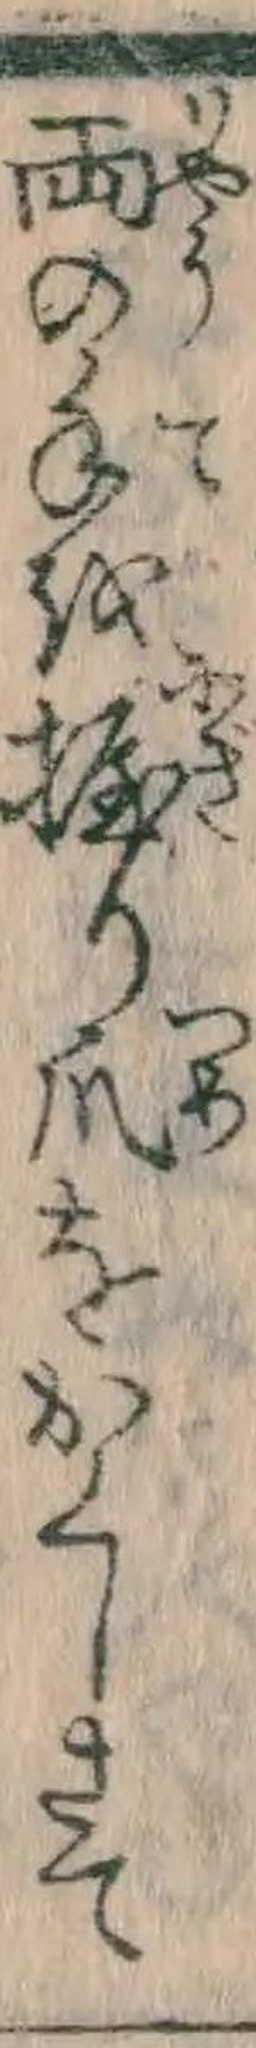両の手を握り爪をかくしさて
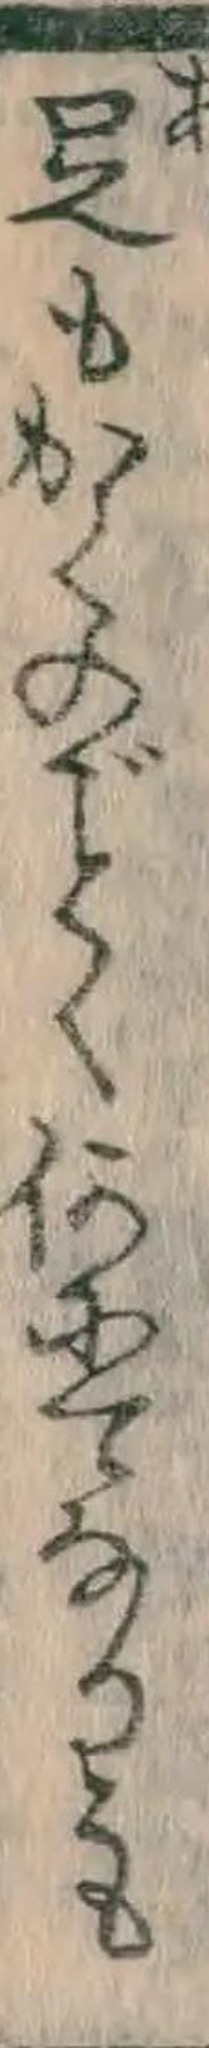足もかくのごとく何にてなりとも
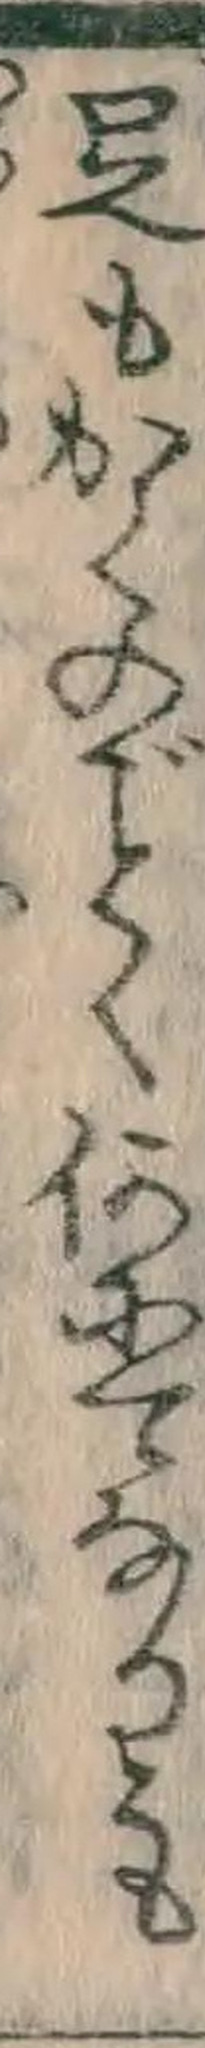足もかくのごとく何にてなりとも
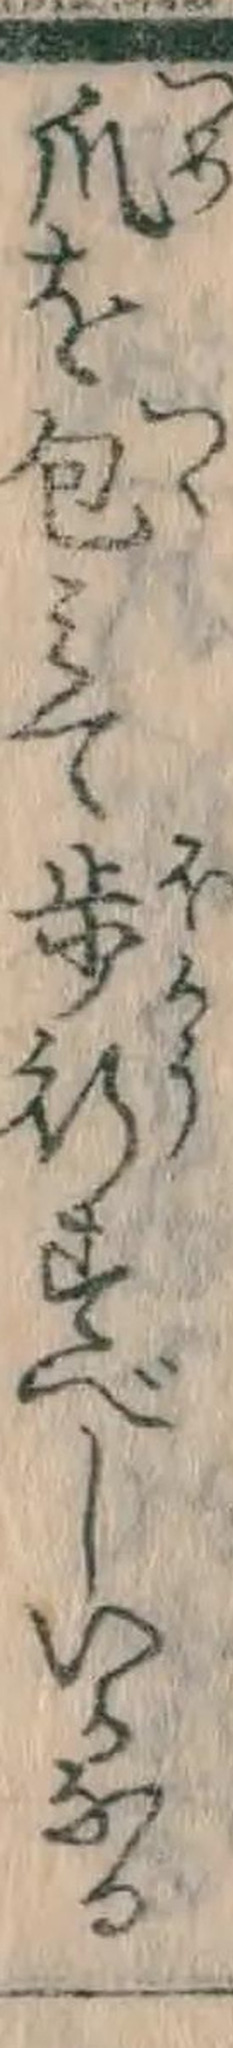爪を包みて歩行すべしいかなる
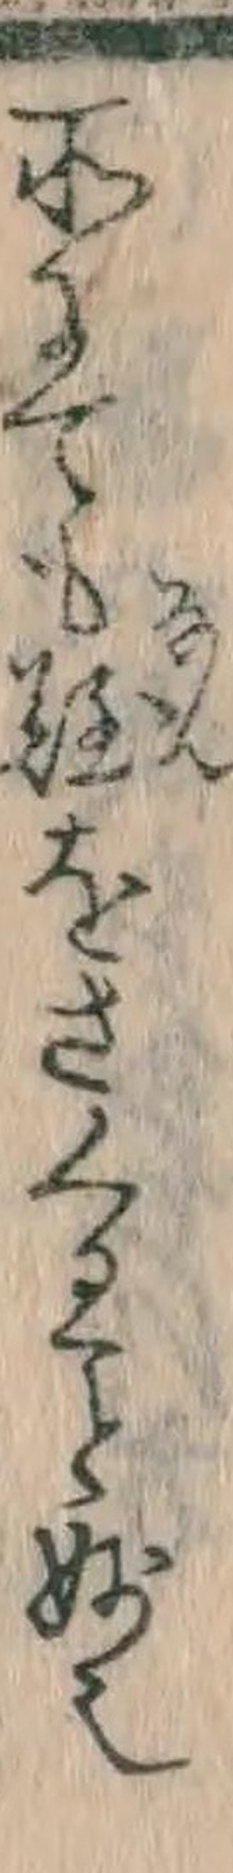所にても難をさくること妙也
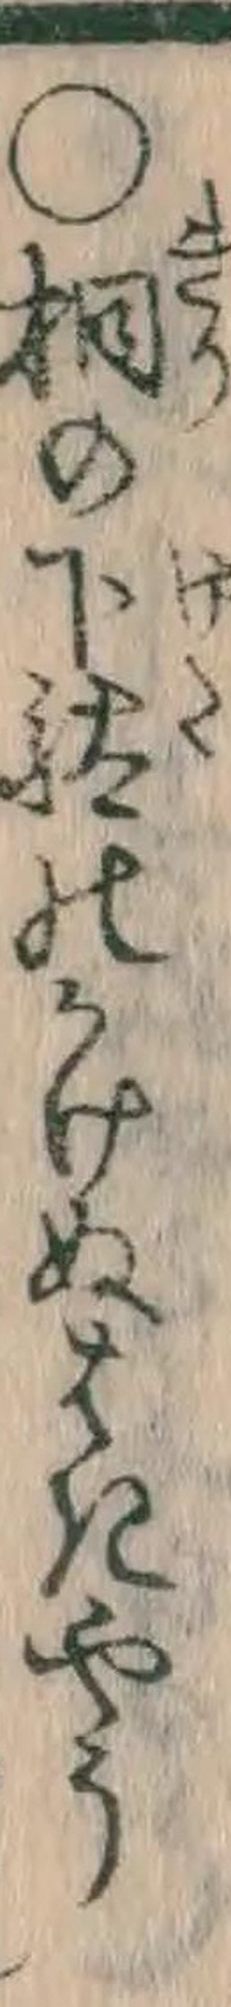○桐の下駄のかけぬはきやう
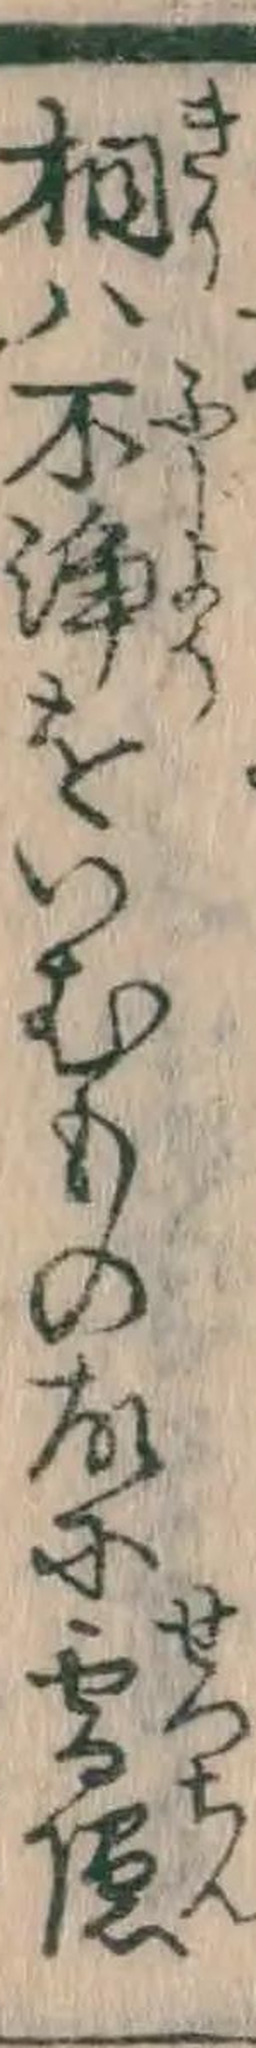桐は不浄をいむもの故に雪隠
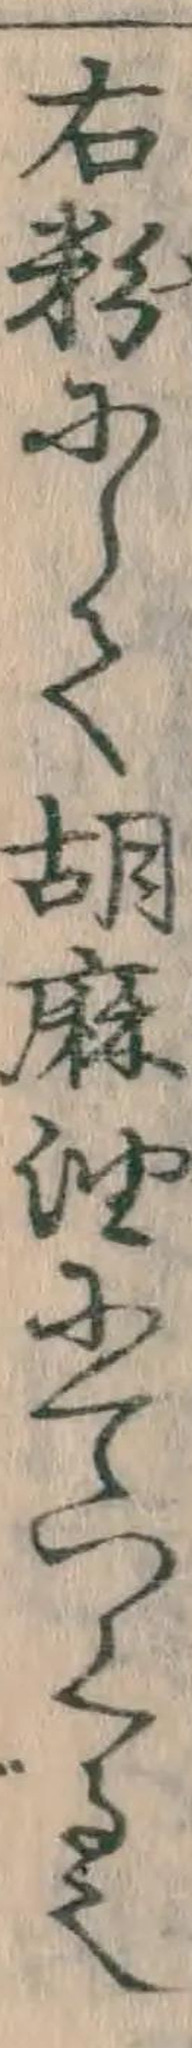右粉にして胡麻油にてつくる也
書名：広益秘事大全 3巻. [4]
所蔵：国立国会図書館 National Diet Library, JAPAN
